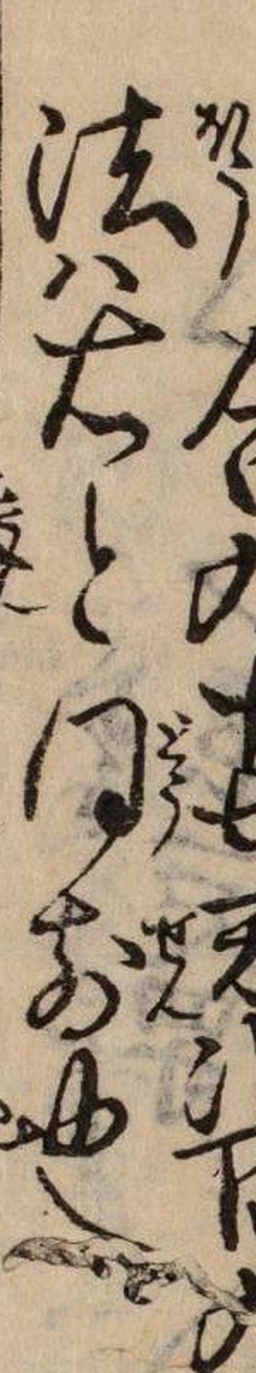法は右と同前也
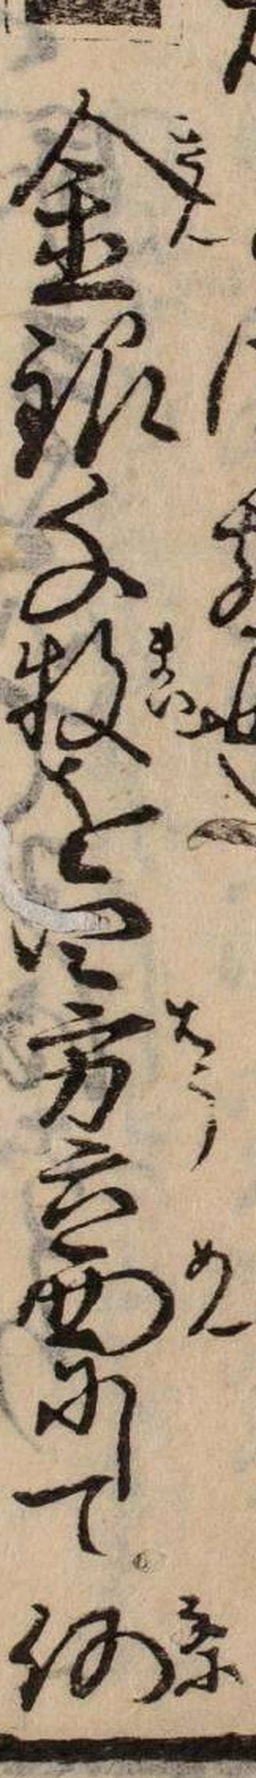第十金銀千枚を四方六面にして何
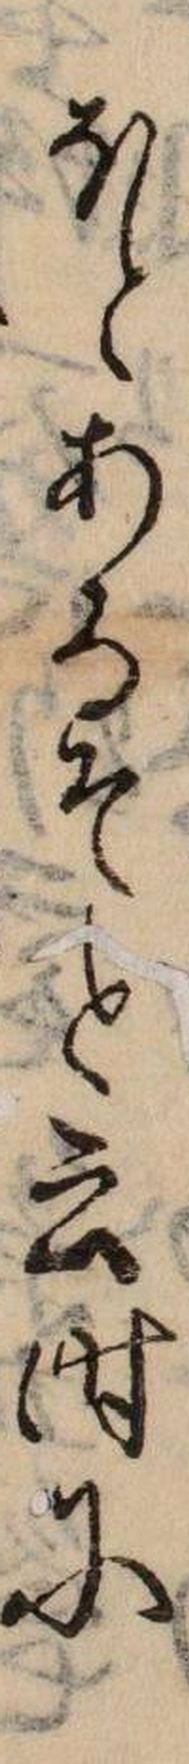ほとあるそと云時に
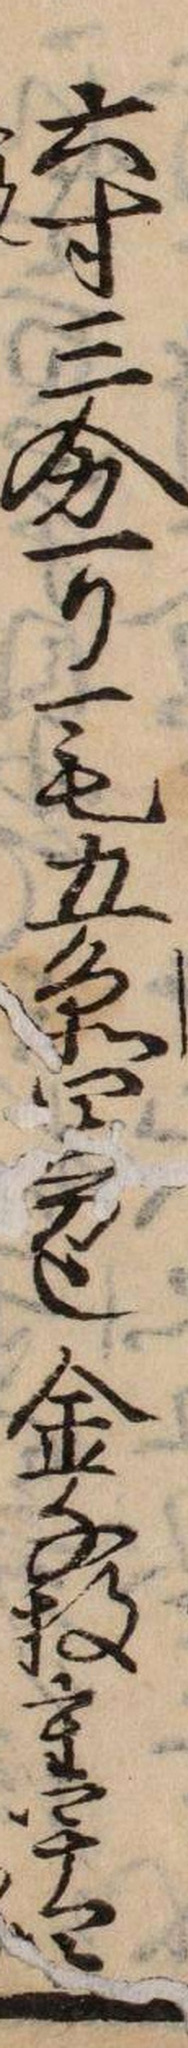六寸三分一り一毛五糸四方也金千枚重四十四
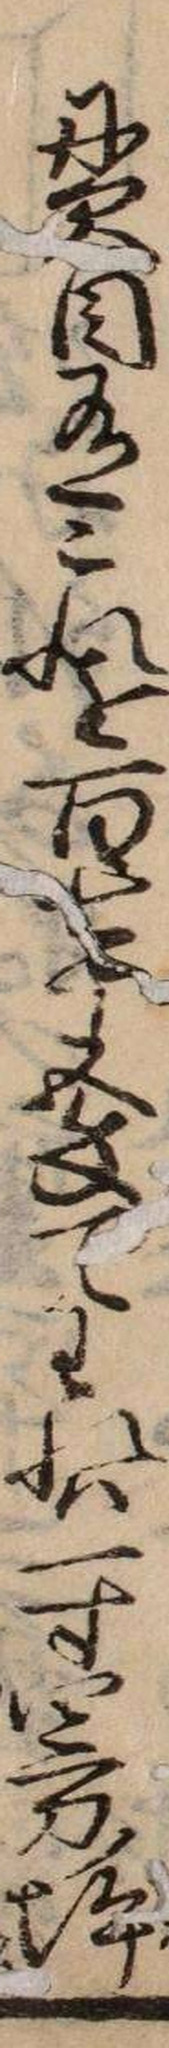貫目有これを百七十五匁てわれは一寸四方の坪

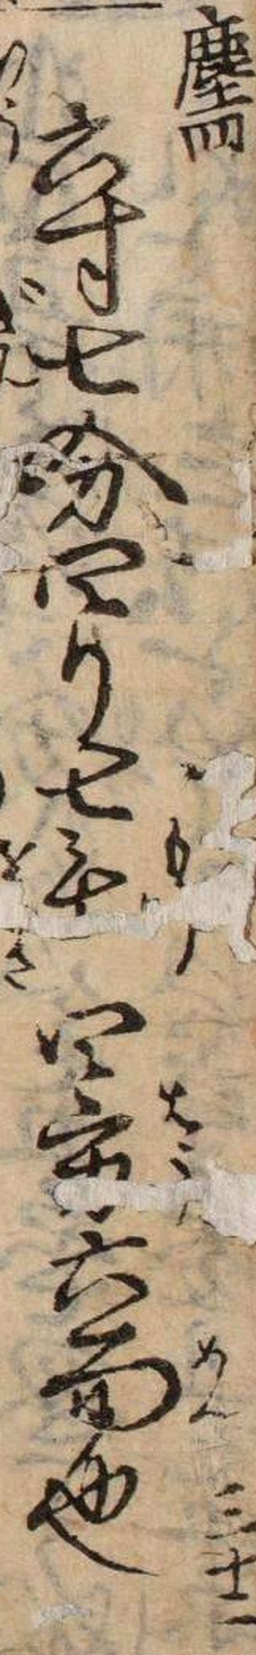六寸七分四り七毛四方六面也
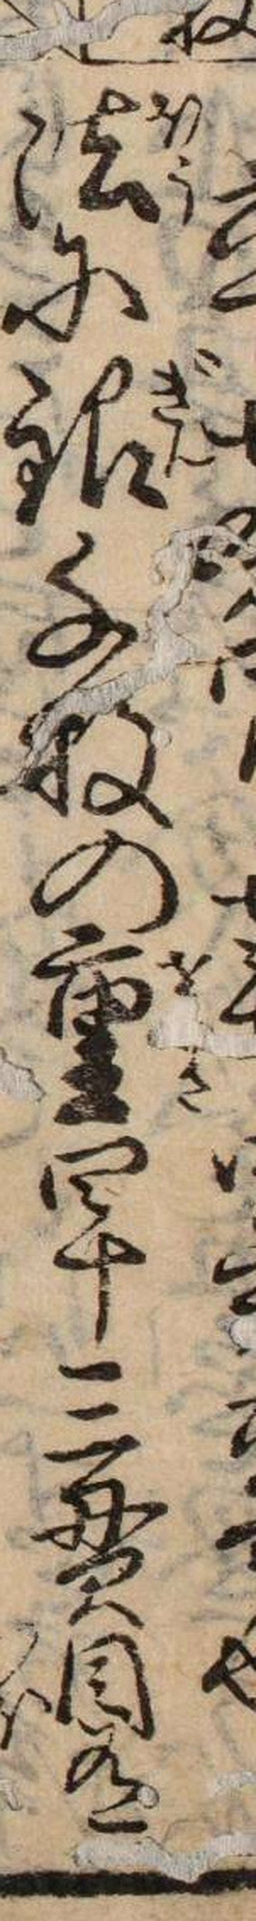法に銀千枚の重四十三貫目有
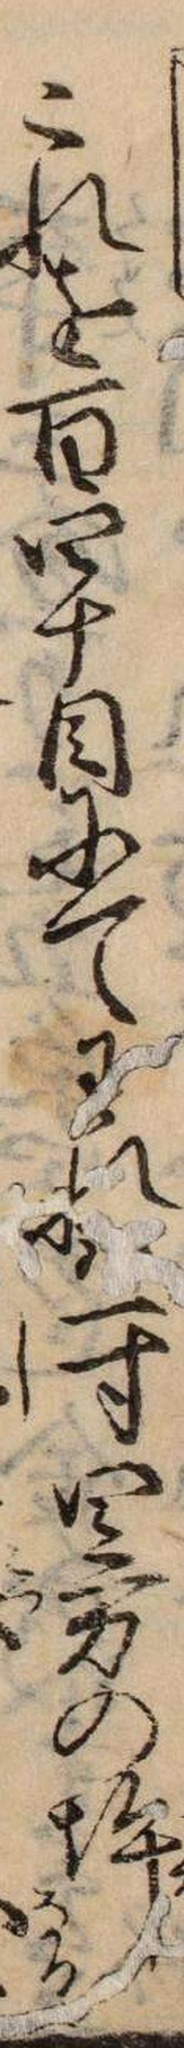これを百四十目にてわれは一寸四方の坪に坪
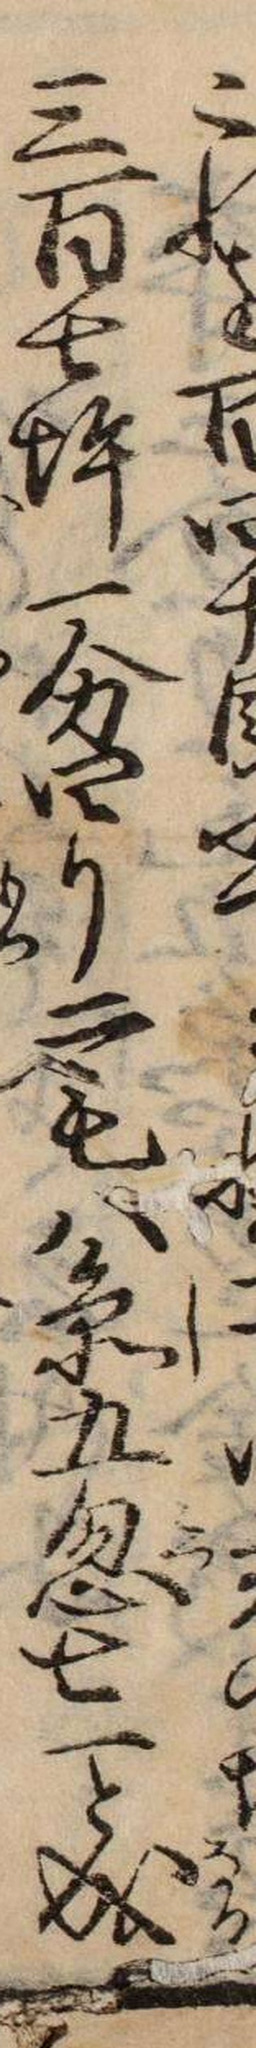三百七坪一分四り二毛八糸五忽七一と成
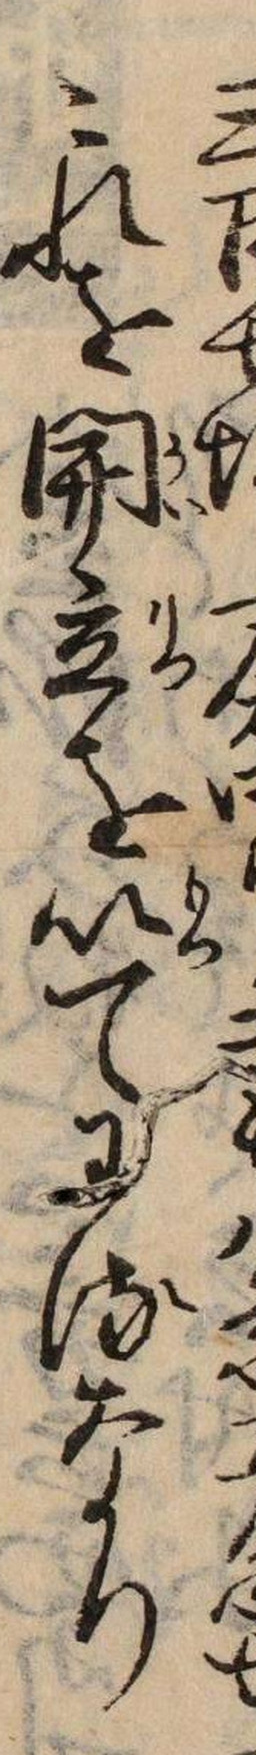これを開立を以てわるなり
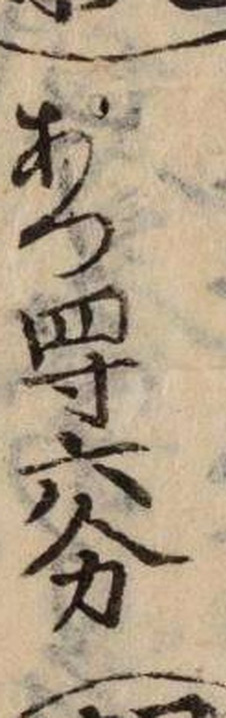あつ四寸六分
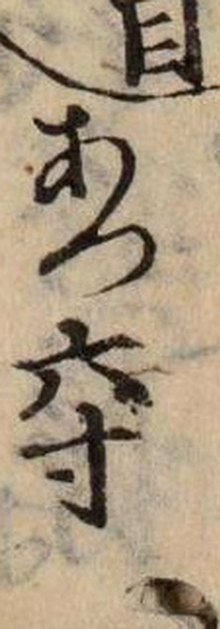あつ六寸
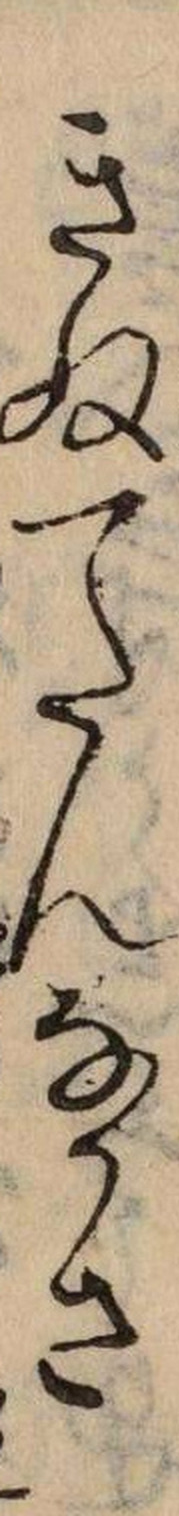きぬてたんなかさ
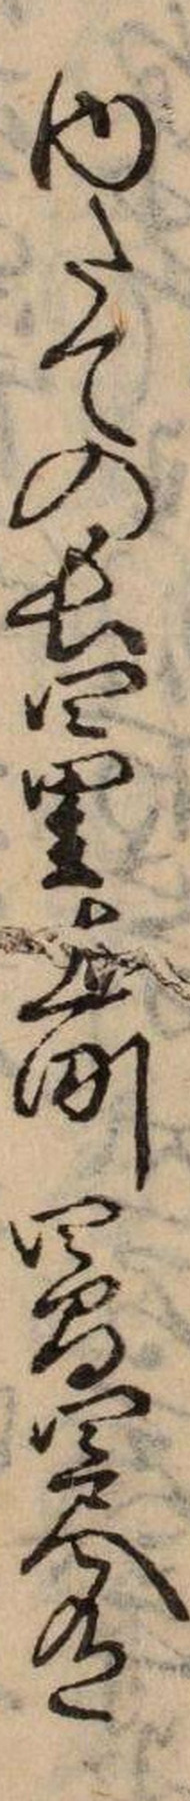内たての長四里十一町四間四尺有
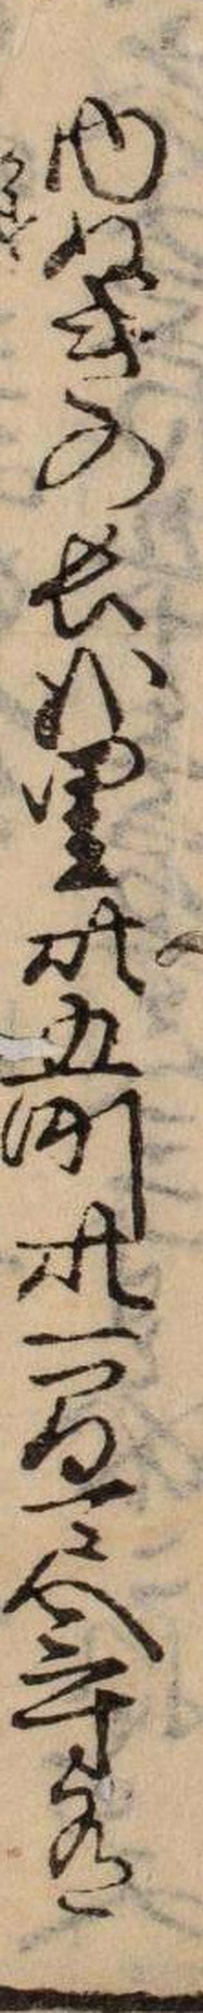内ぬきの長弐里卅五町卅一間一尺三寸有
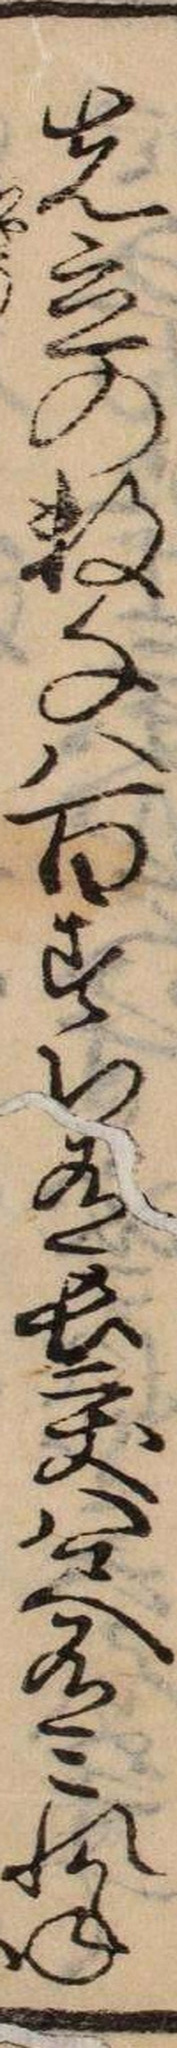先立の数千八百すち有長二丈八尺有これかね
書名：塵劫記（寛永11年自跋、京都府立京都学・歴彩館追貴8）
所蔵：京都府立京都学・歴彩館 国文学研究資料館
